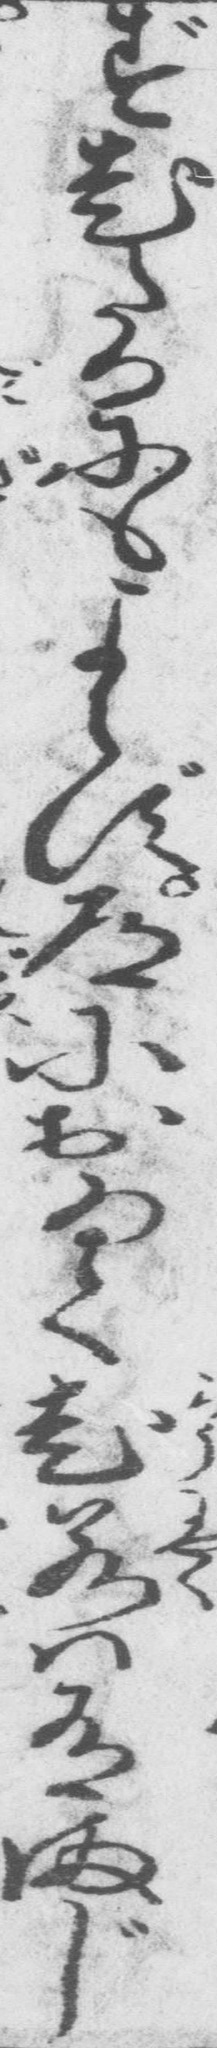ず老たるにもよらず。道におゐて老若は有まじ
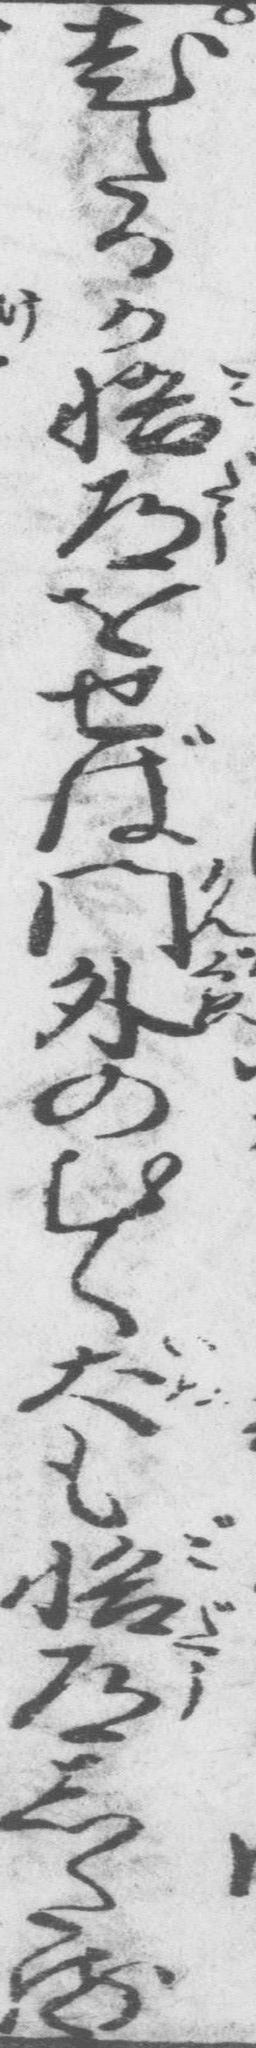。老たるか悟道をせば門外のむく犬も悟道したる
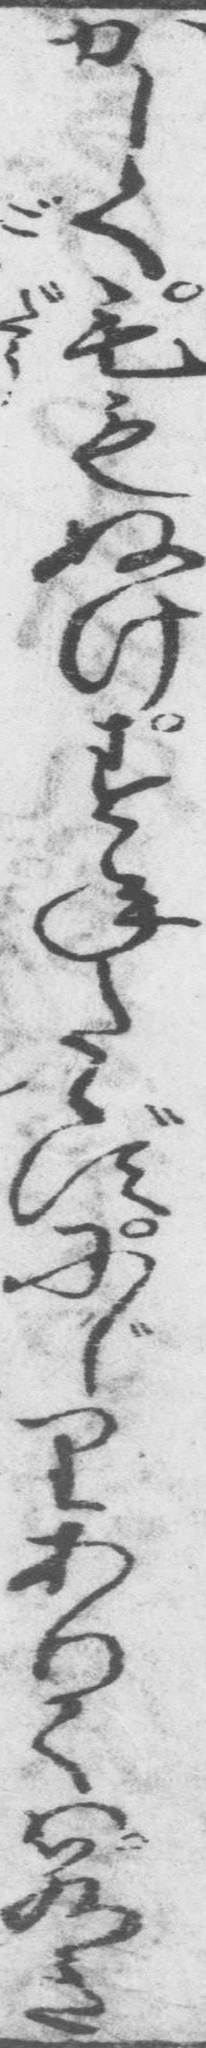かしく。毛もぬけ。すねたゝず。にじりありくは。若き
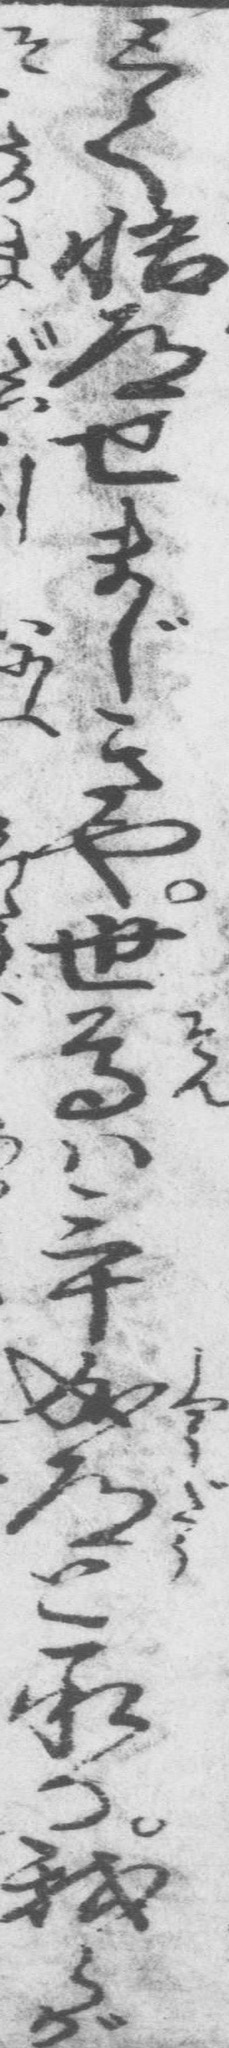とく悟道せまじきや。世尊は三十成道と承り。我らが
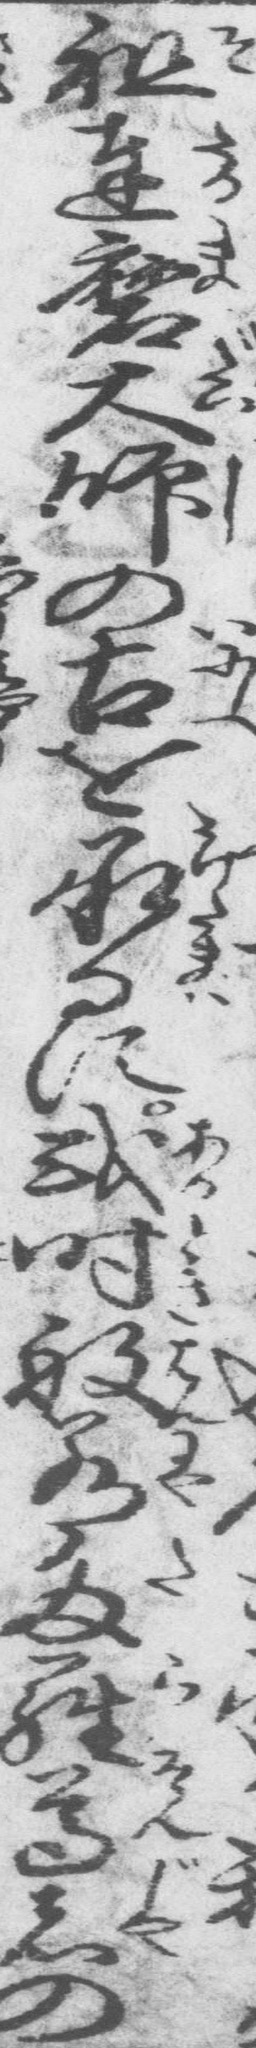祖達磨大師の古を承るに。或時般若多羅尊者の
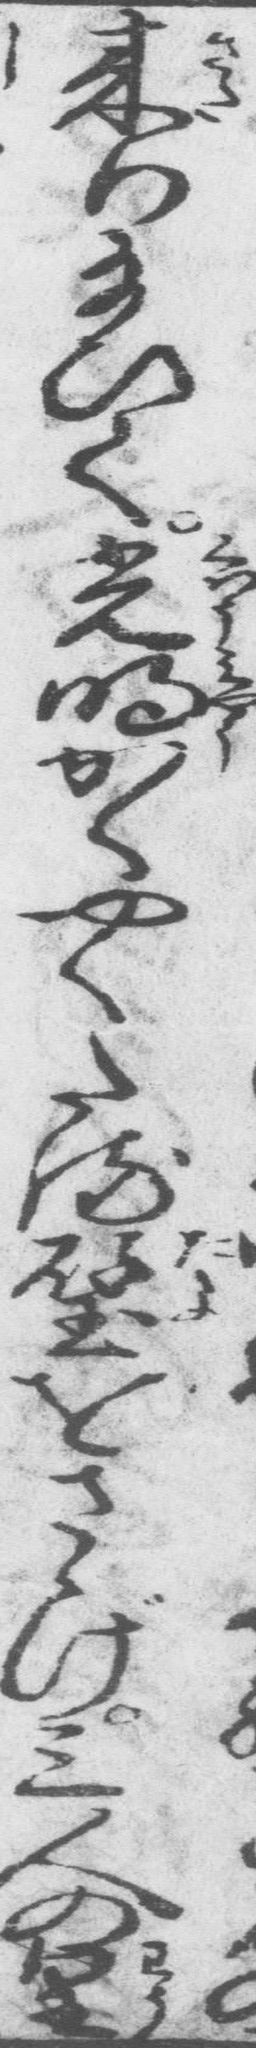来り給ひて。光明かくやくたる璧をさゝげ。三人の皇
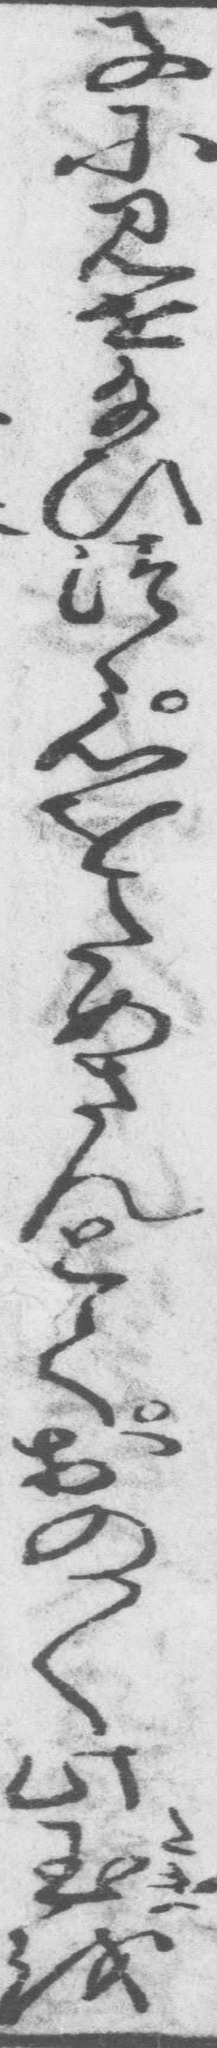子に見せ給ひつゝ。心をためさんとて。おの〳〵此玉を

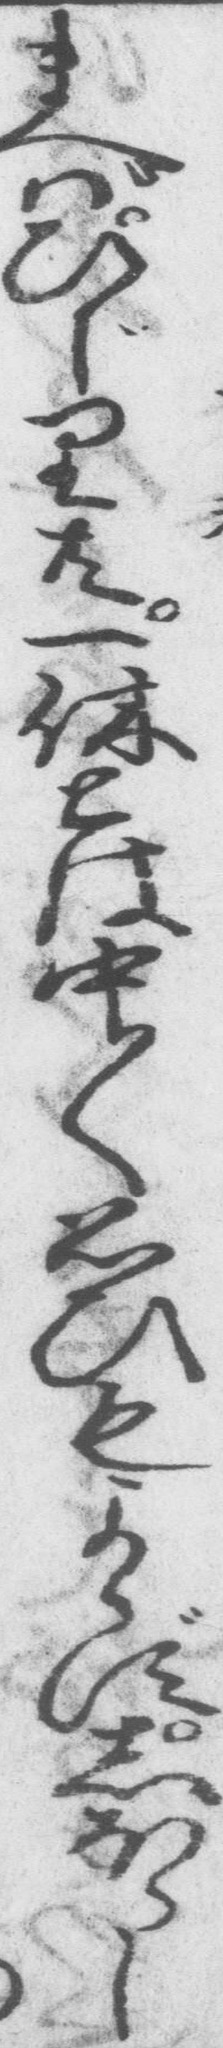まへば。ひじり共。一休とは中〳〵思ひもよらず。しほらし
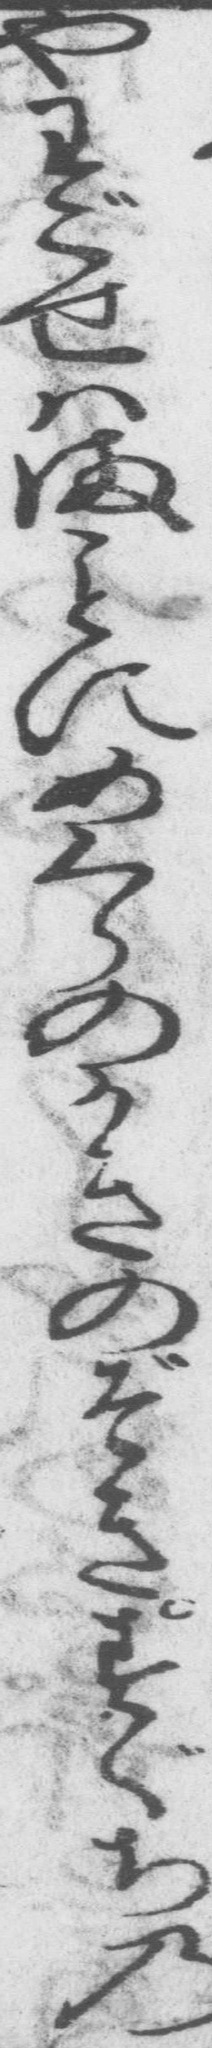やわごせはまことすめくらのかきのぞき。すぐちの
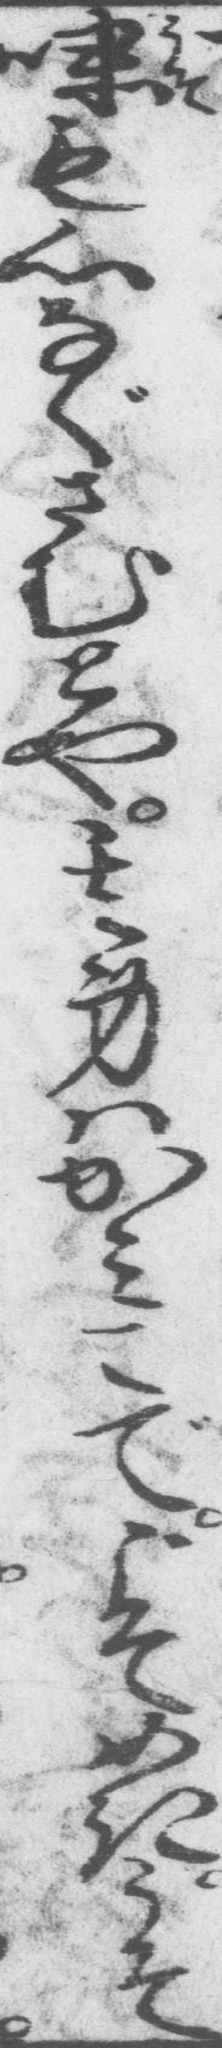も心なぐさむとや。其身はかみこで。こそめき。うそ
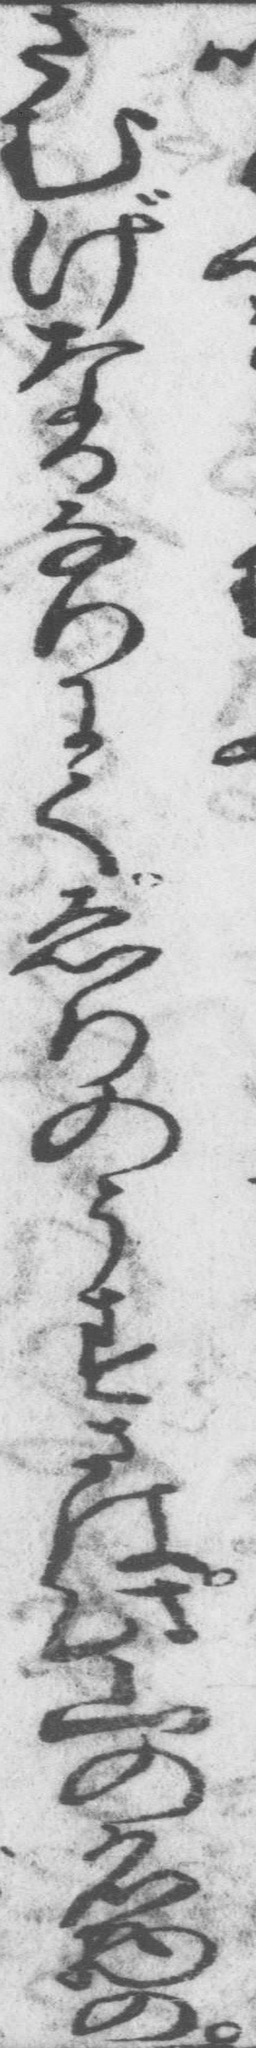さむげなるなりにてゑりのうすさは此山の名物の
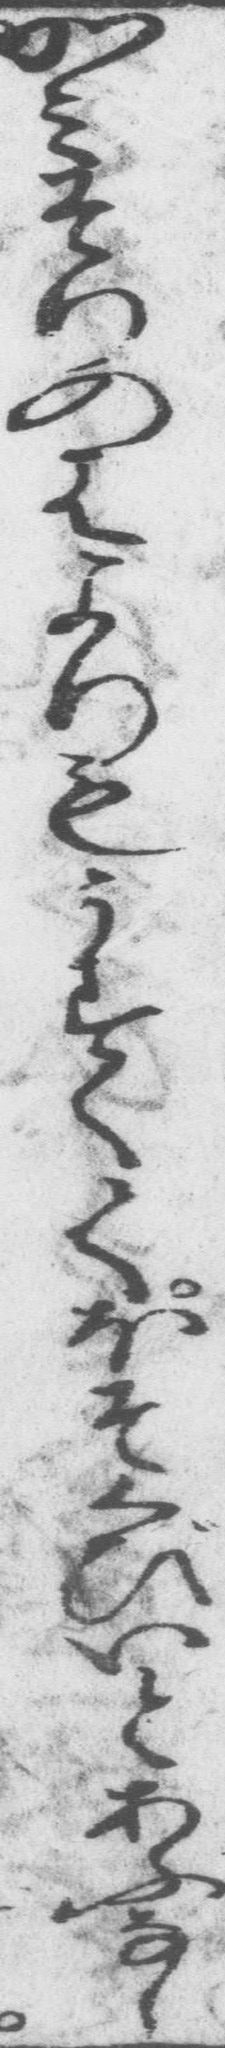かみそりのはよりもうすく。ほそくびいとあふなし
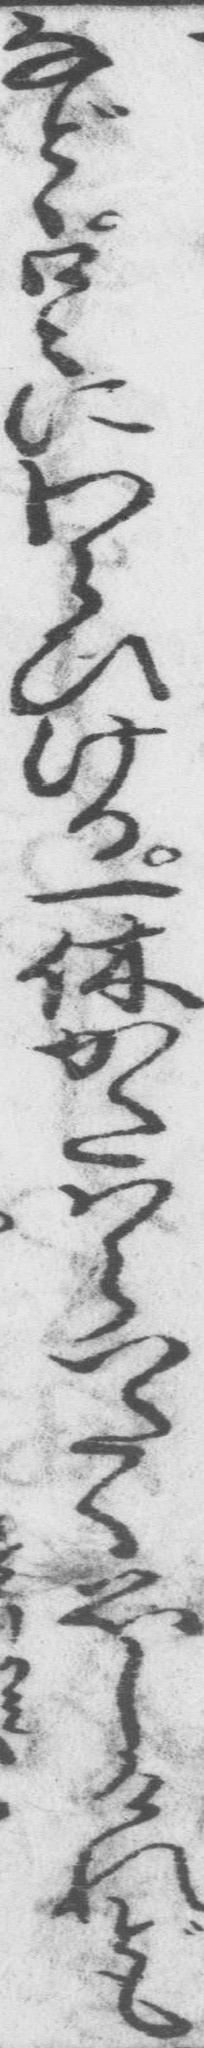などゝ。口々にわらひける。一休かたはらいたく思しけれども。
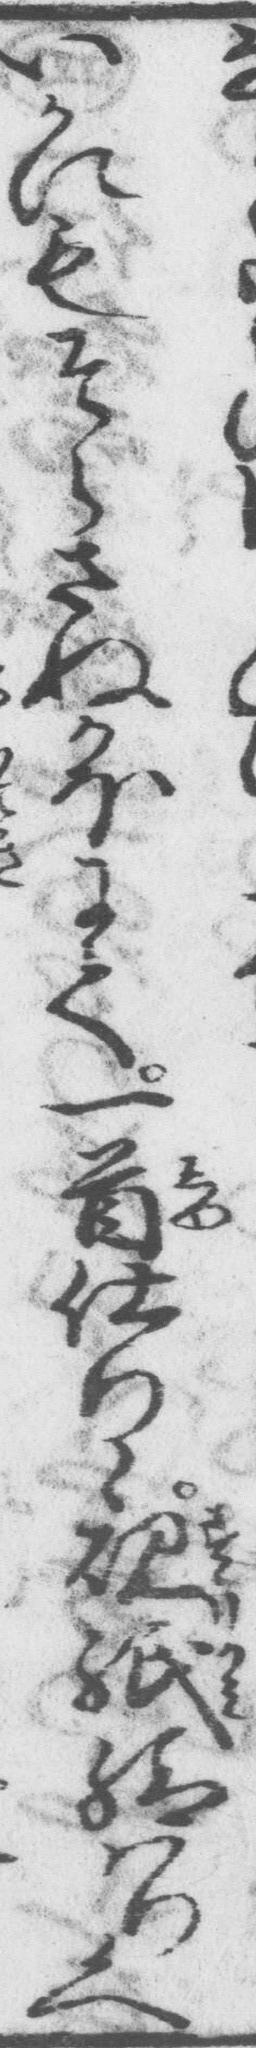いかにもそらさぬかほにて一首仕りて。硯紙給はり候へ
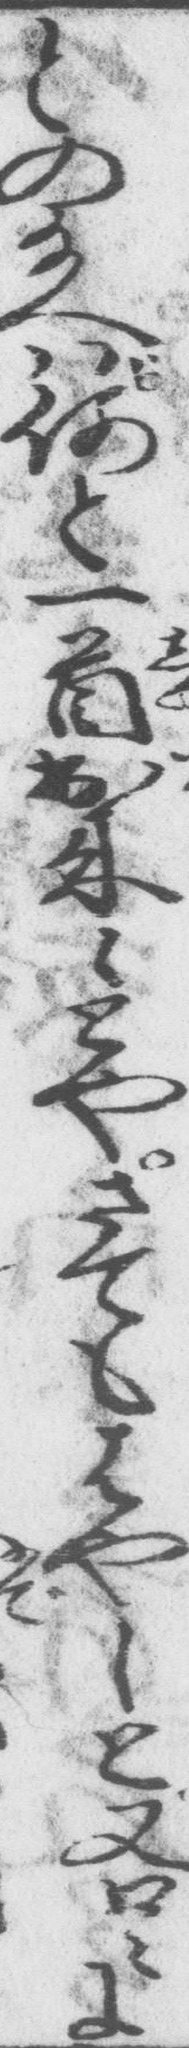との給へば。何と一首出来候とや。さてもはやしと。又口々に
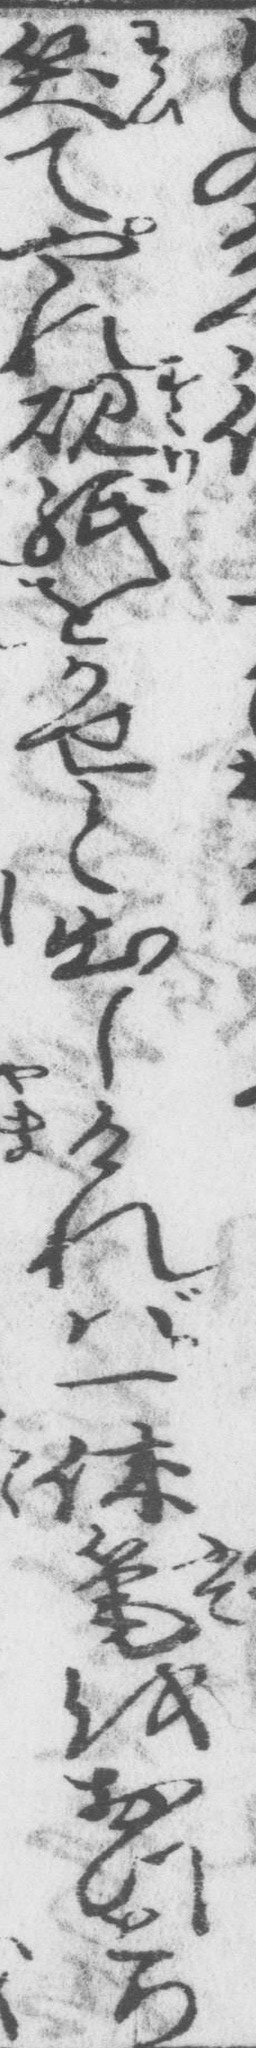笑て。やれ硯紙をかせと出しければ一休筆をおつとり
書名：一休はなし（元禄十三）
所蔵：大阪公立大学中百舌鳥図書館 国文学研究資料館
